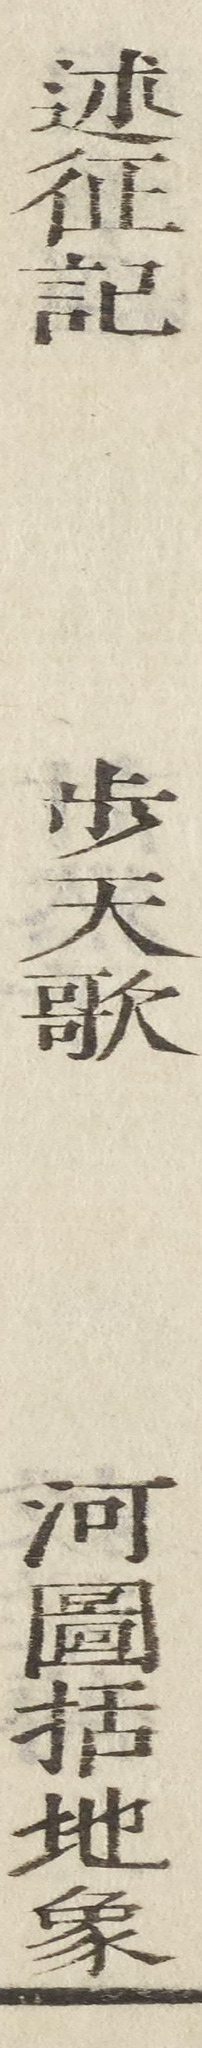述征記歩天歌河図括地象
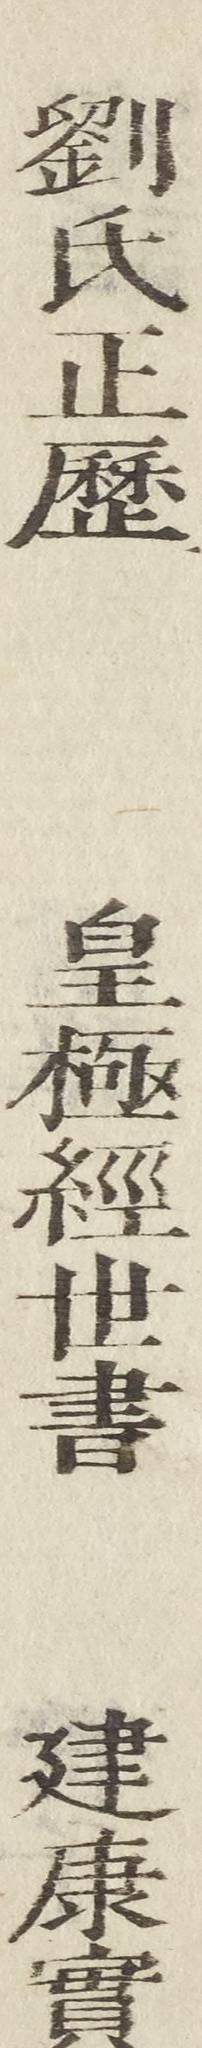劉氏正歴皇極経世書建康実録
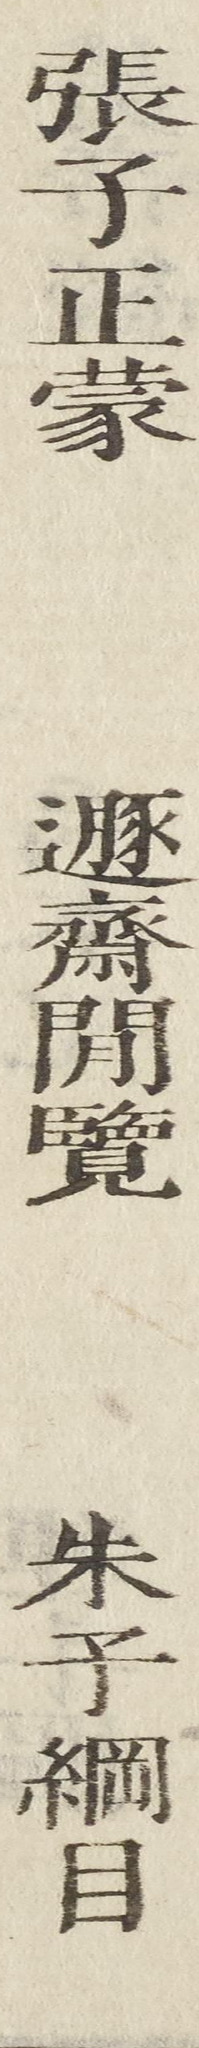張子正蒙遯齋閒覧朱子綱目
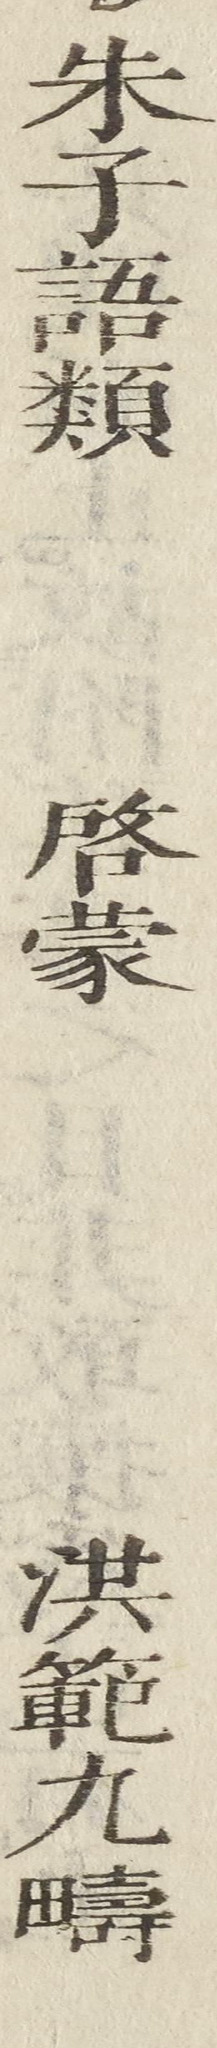朱子語類啓蒙洪範九畴
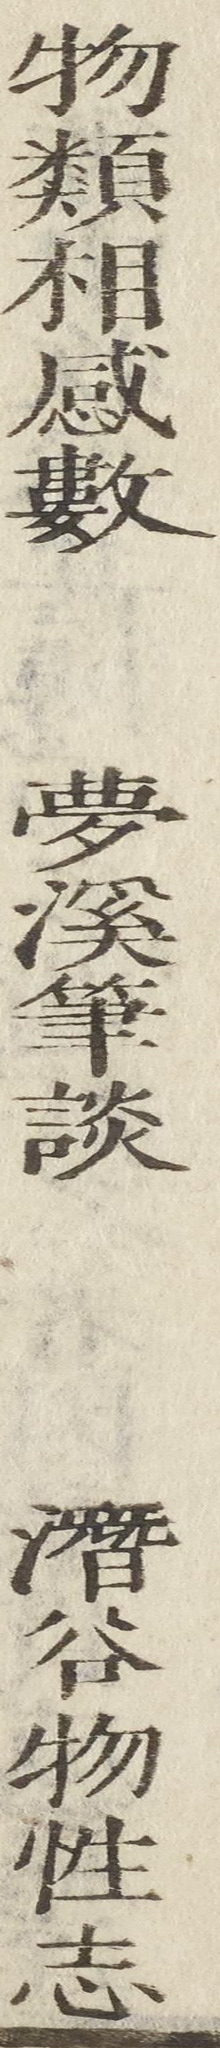物類相感数夢渓筆談潛谷物性志
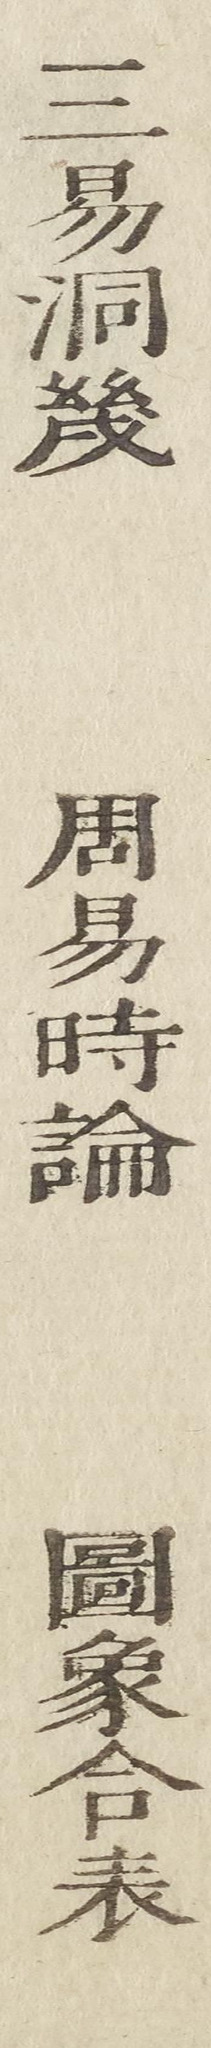三易洞幾周易時論図象合表
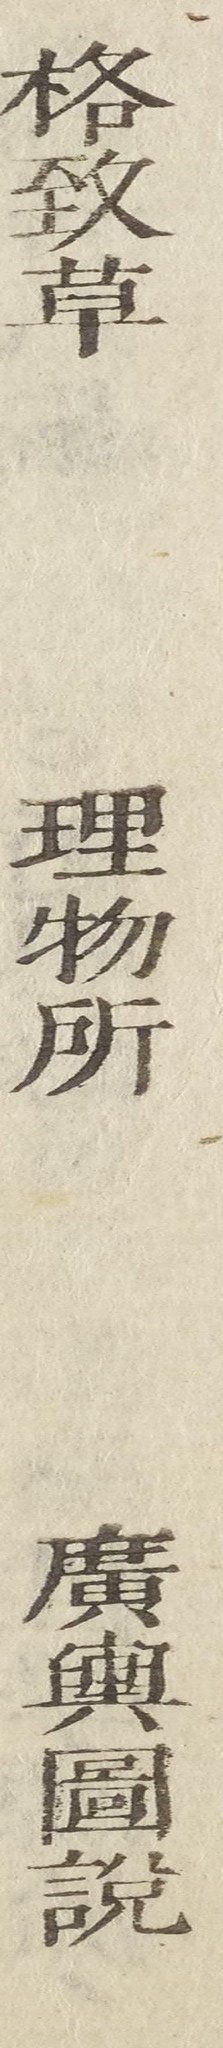格致草理物所広輿図説
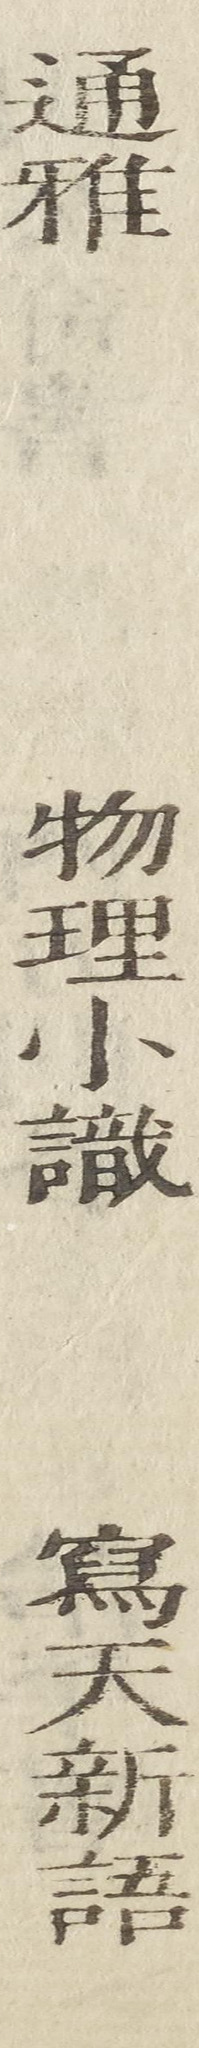通雅物理小識写天新語
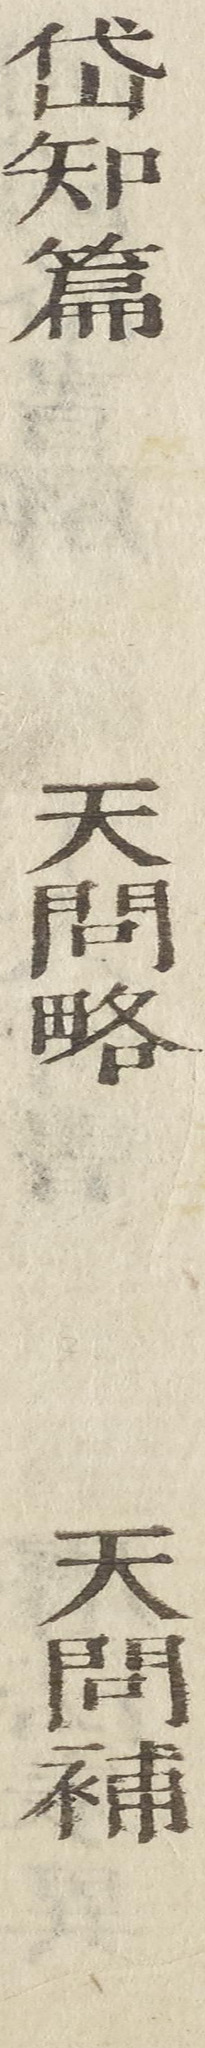岱知篇天問略天問補
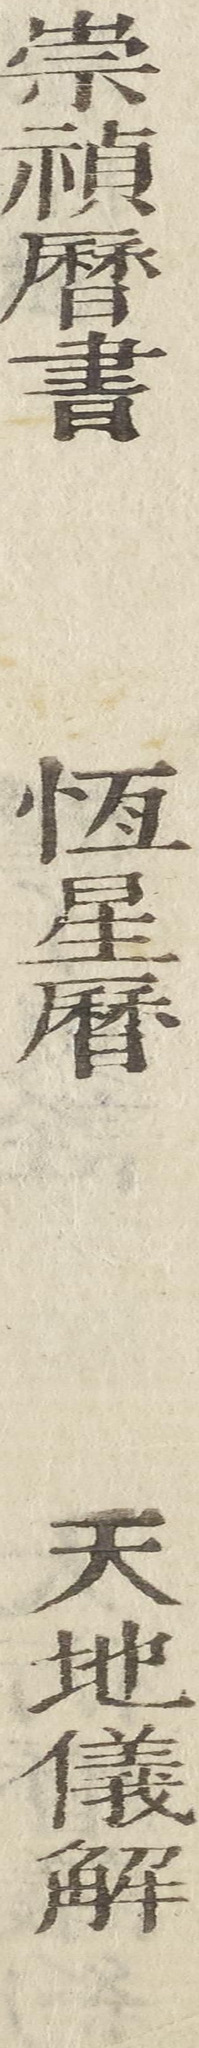崇禎暦書恒星暦天地儀解
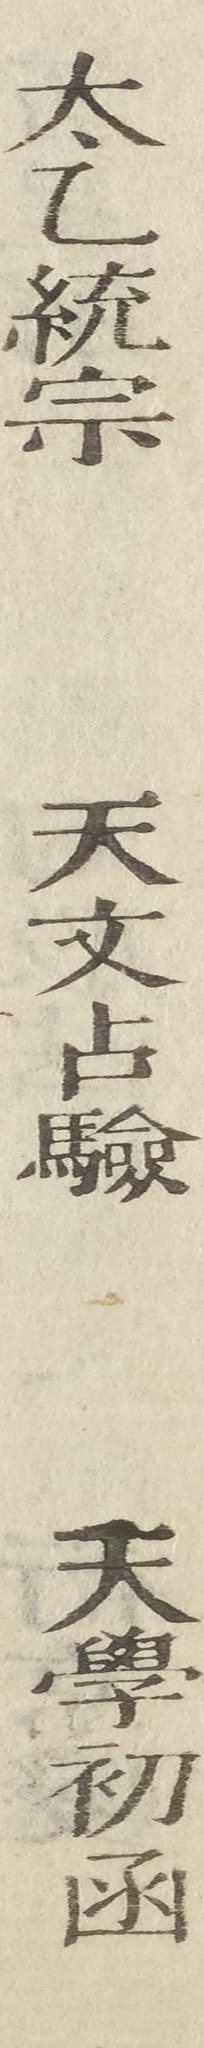太乙統宗天文占験天学初函

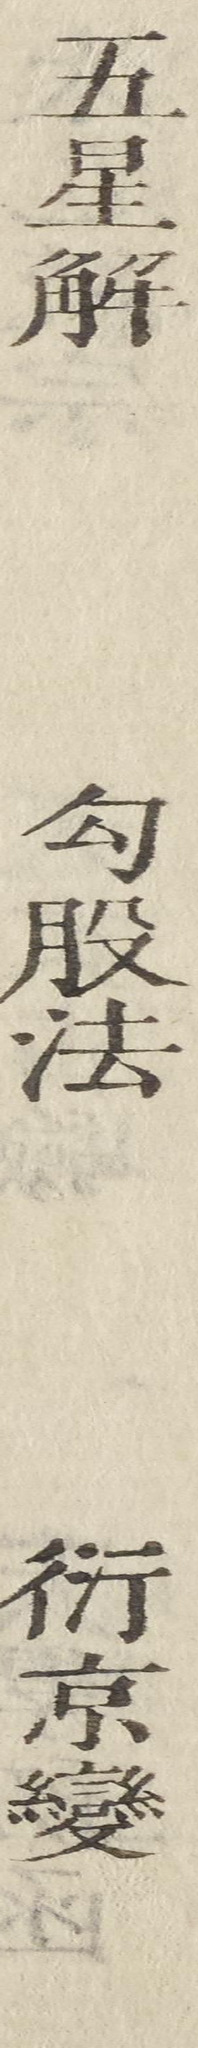五星解勾股法衍京変
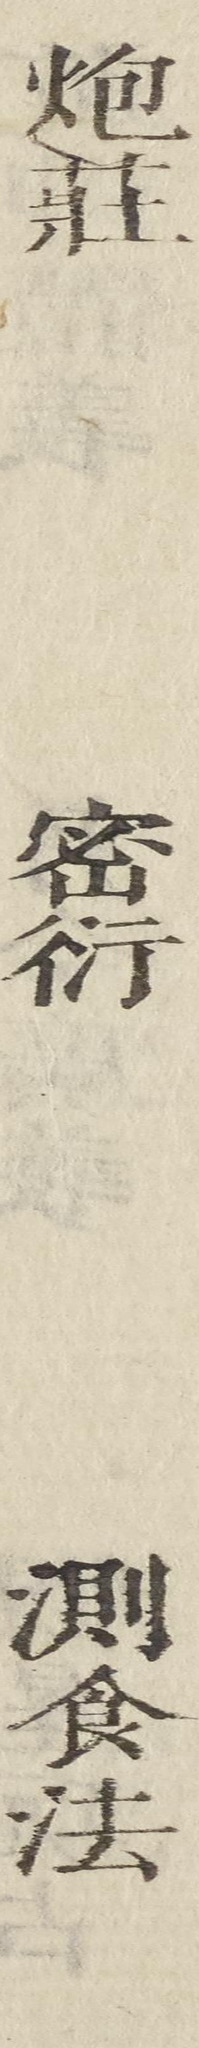炮荘蜜衍測食法
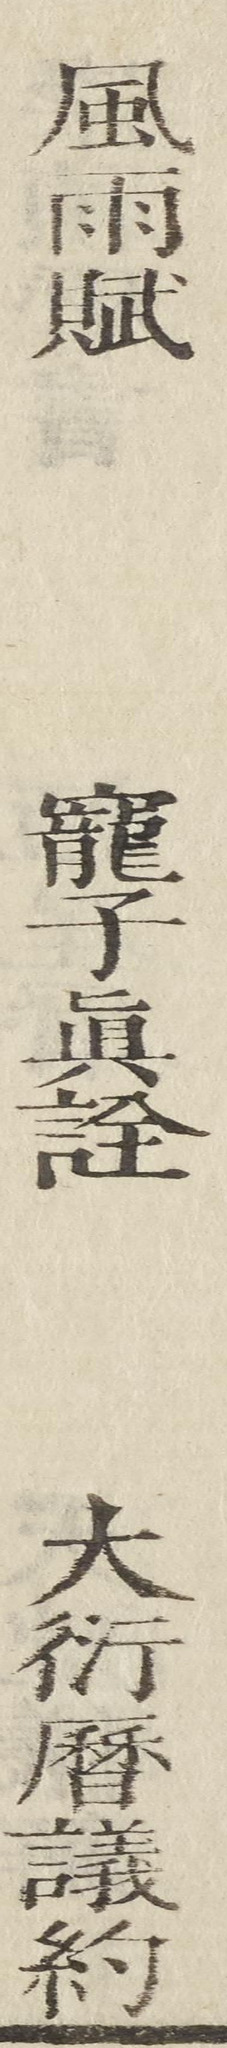風雨賦寵子真詮大衍暦議約
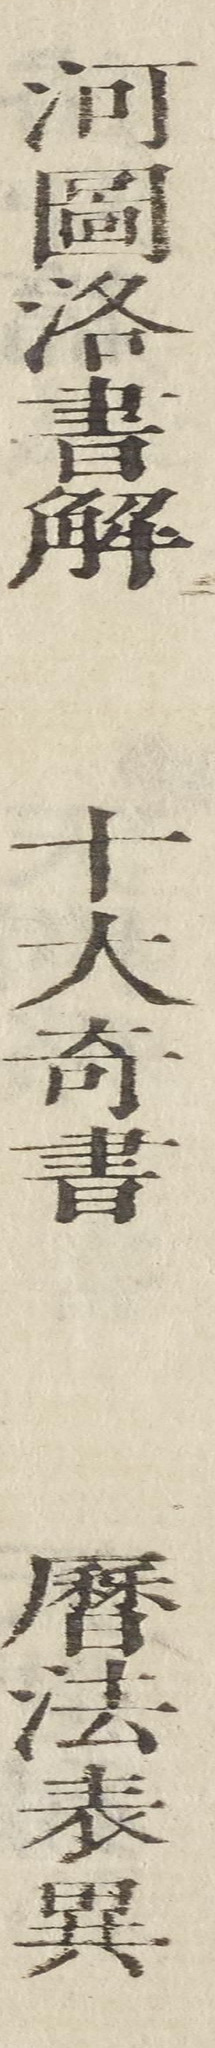河図洛書解十大奇書暦法表異
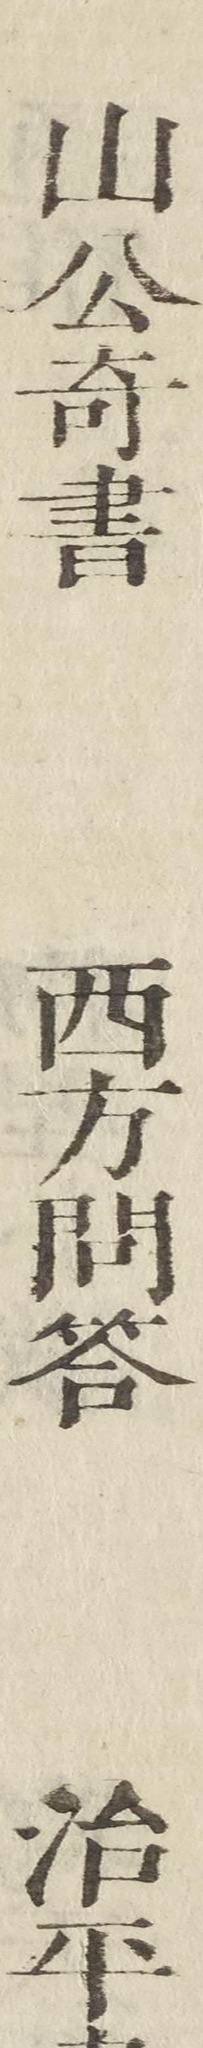山公奇書西方問答治平書
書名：天經或問　序圖
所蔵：東京大学地震研究所図書室 Earthquake Research Institute Library, The University of Tokyo, JAPAN
